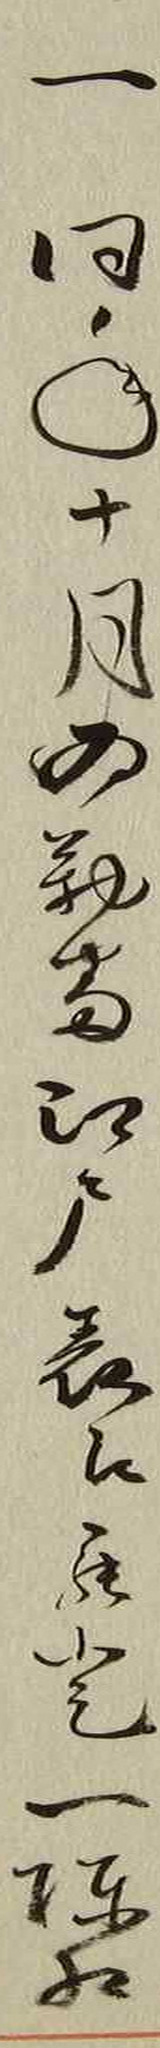一同年十月為御勤番江戸表江罷登一陣相
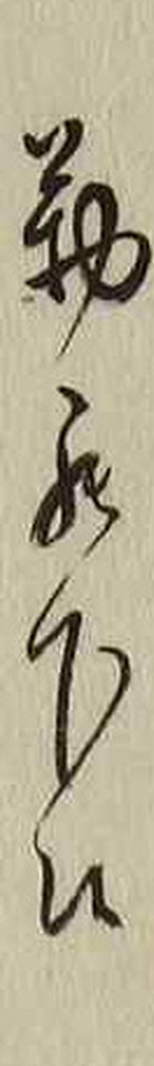勤罷下候
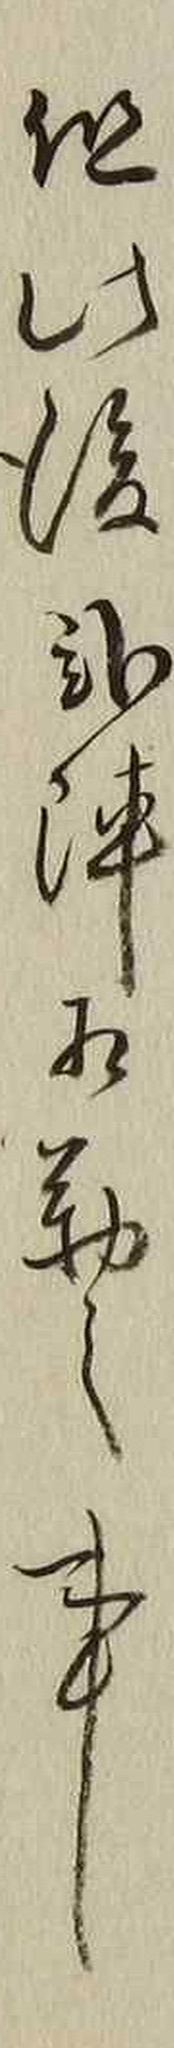但此後弐陣相勤候事
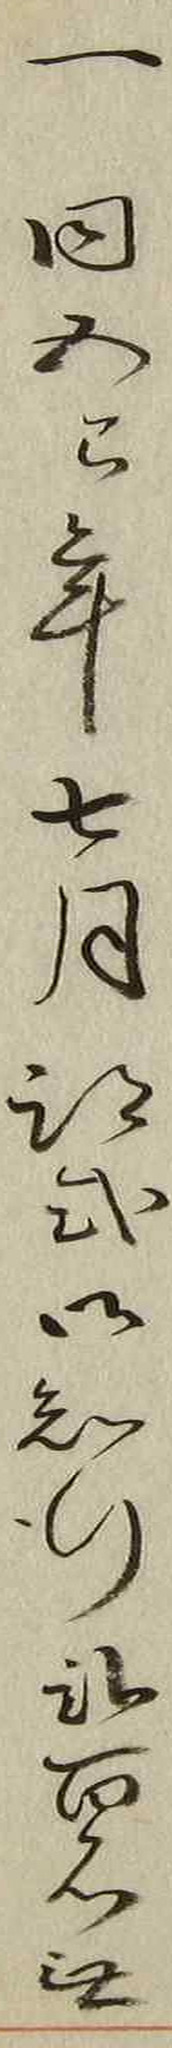一同五巳年七月跡式御知行弐百石無
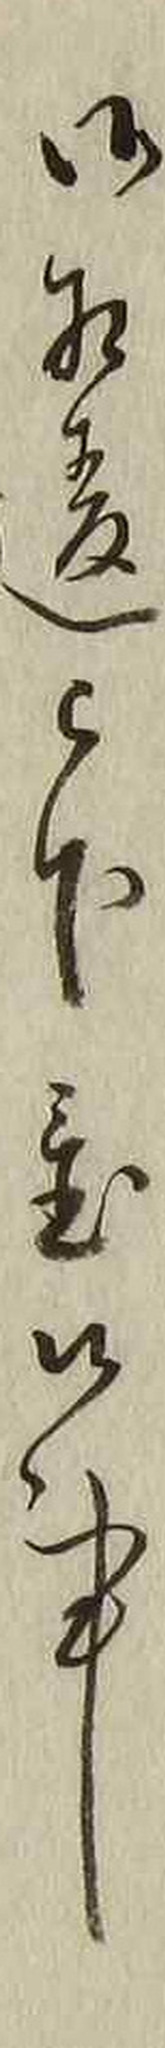御相違被下置候事
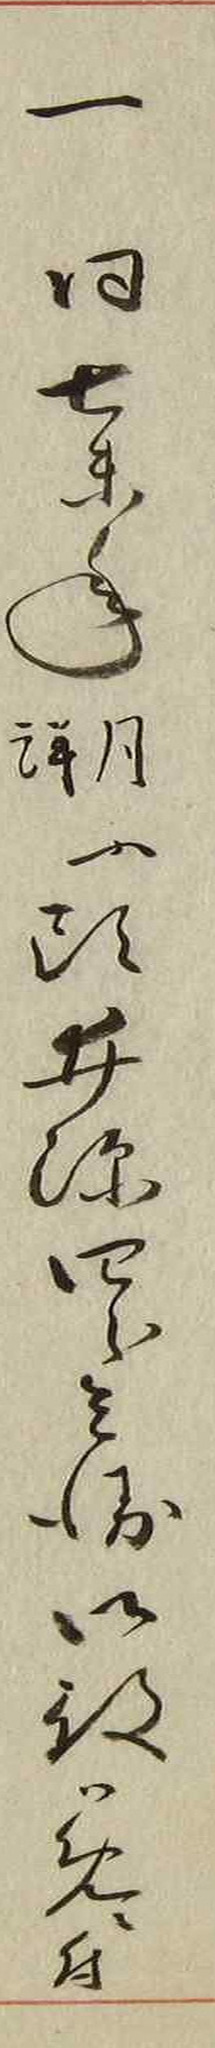一同七未年月不詳頭井深四郎兵衛御役御免に付
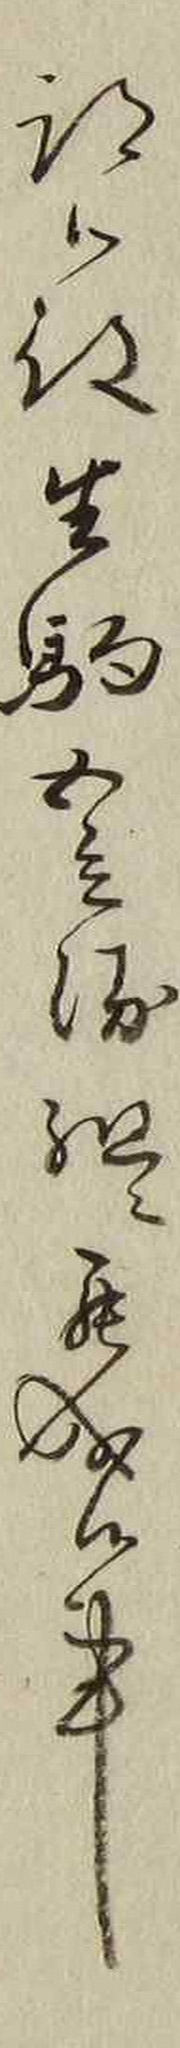跡御役生駒五兵衛組に罷成候事
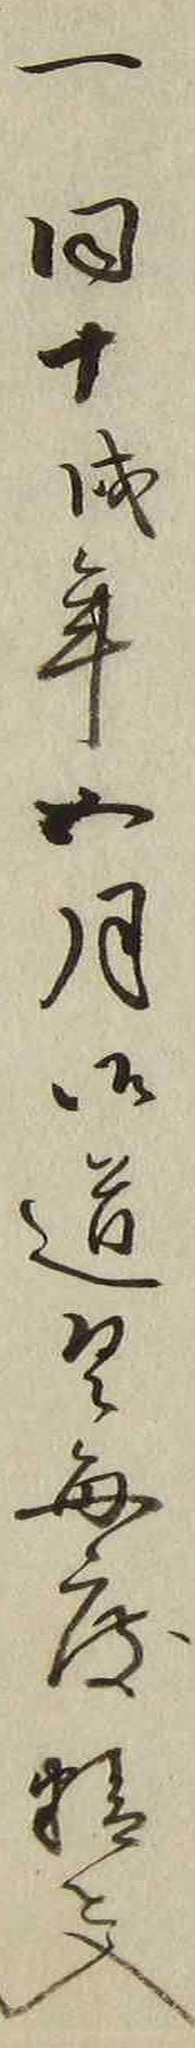一同十戌年五月御道具毎度精を入
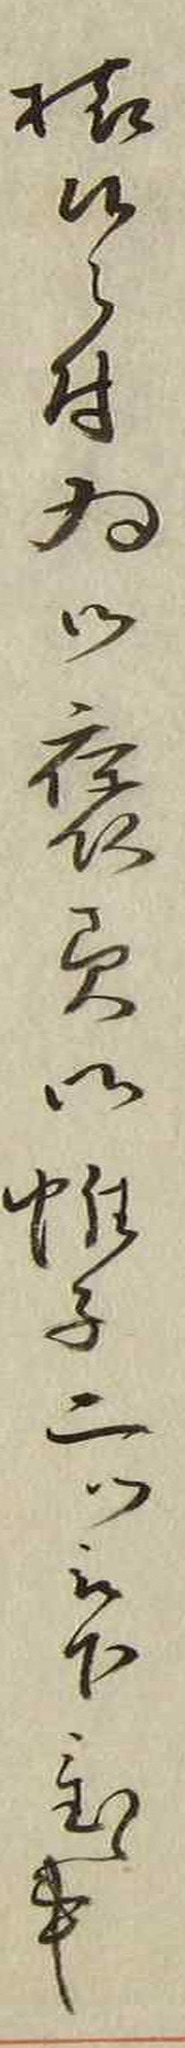様候に付為御褒美御帷子二ツ被下置候事

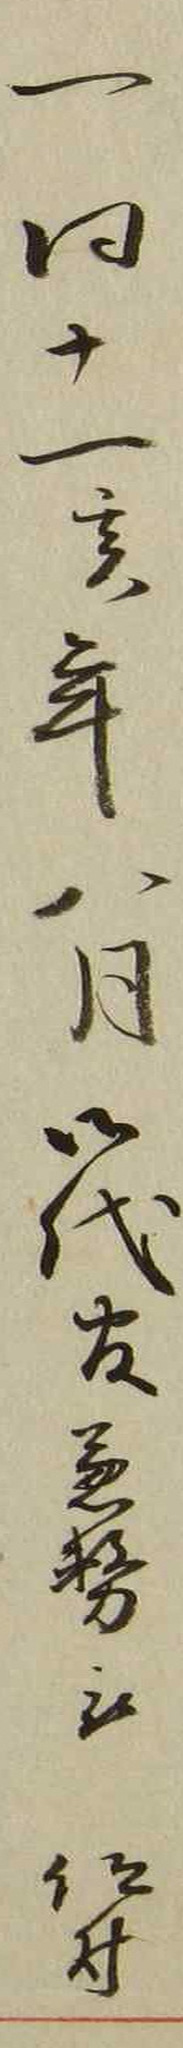一同十一亥年八月御代官兼務被仰付
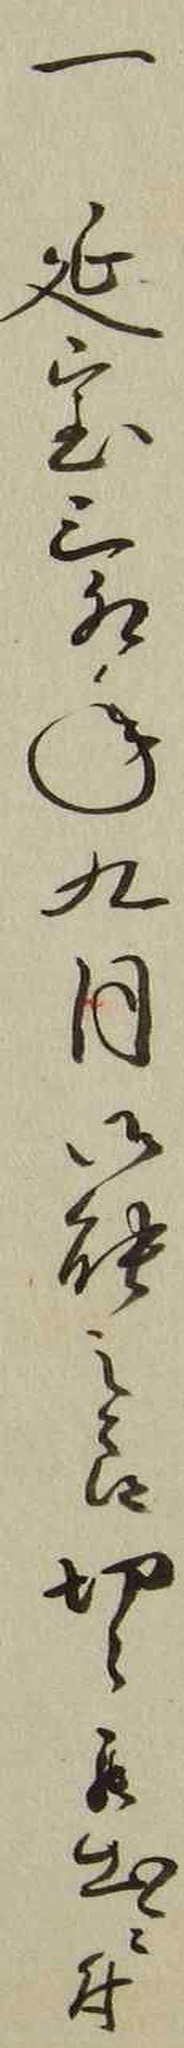一延宝三卯年九月御能之節切々罷出候に付
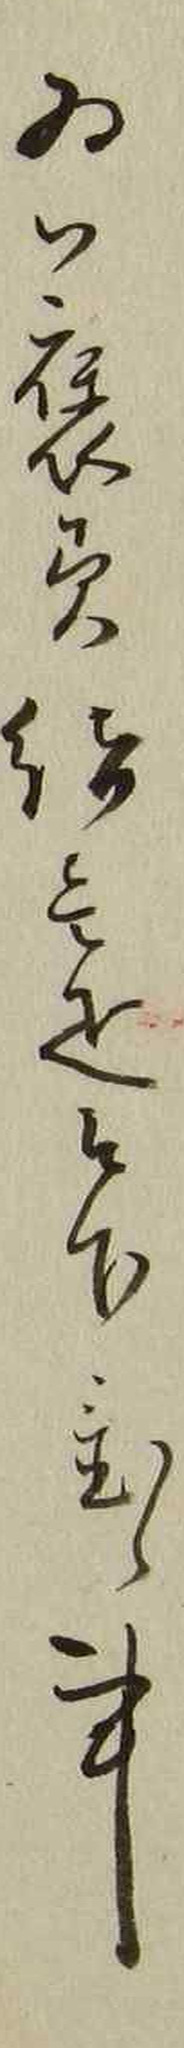為御褒美綿壱疋被下置候事
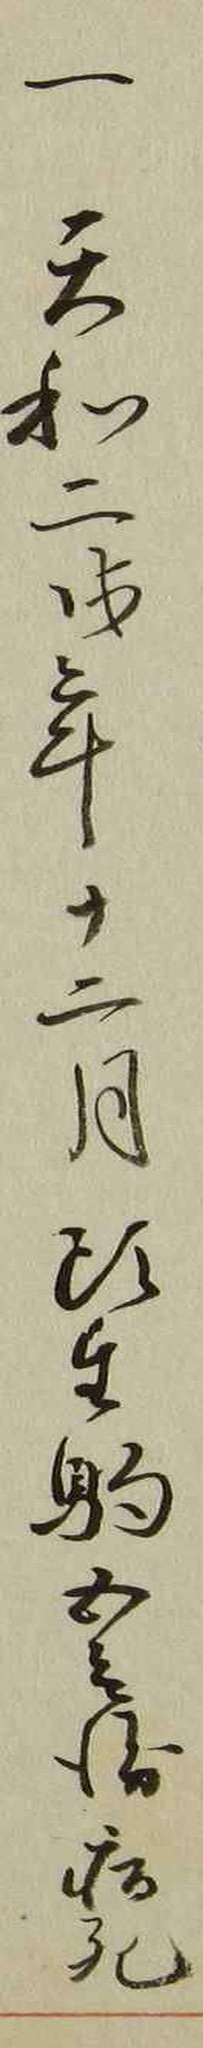一天和二戌年十二月頭生駒五兵衛病死
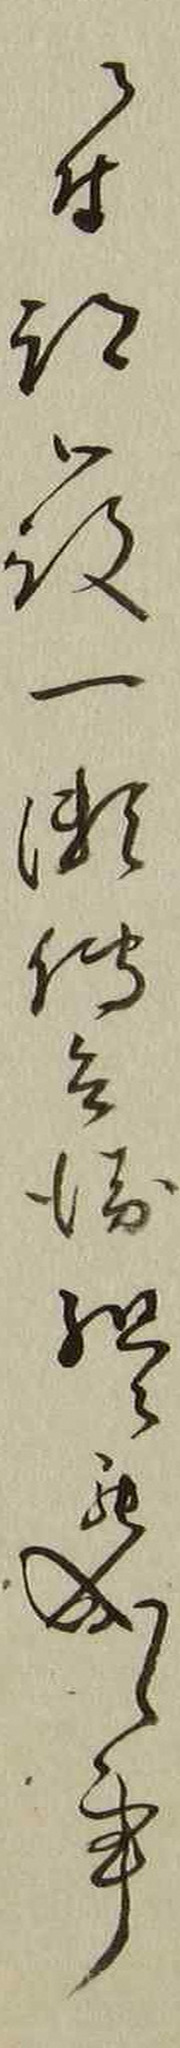に付跡御役一瀬傳兵衛組に罷成候事
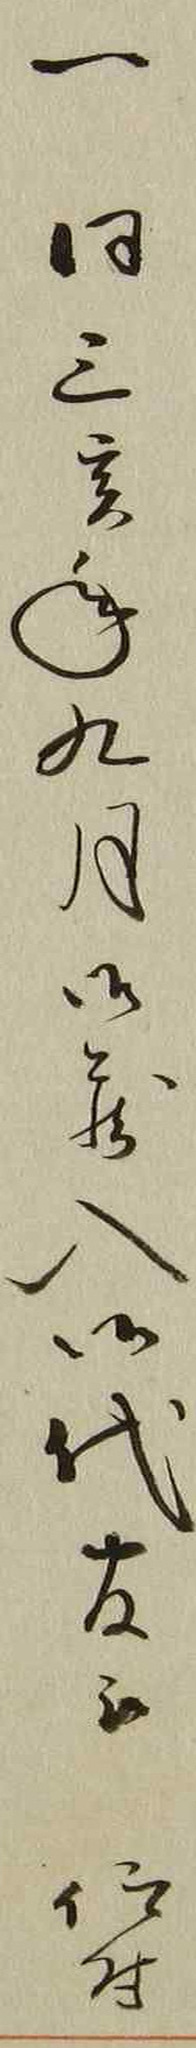一同三亥年九月御蔵入御代官被仰付
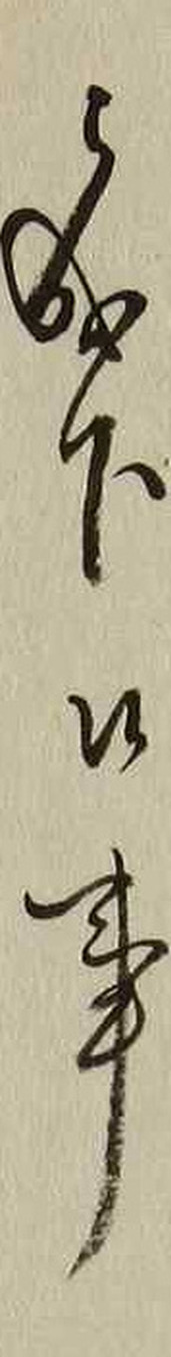被成下候事
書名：諸士系譜　巻之3　い之部3
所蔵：会津若松市立会津図書館
